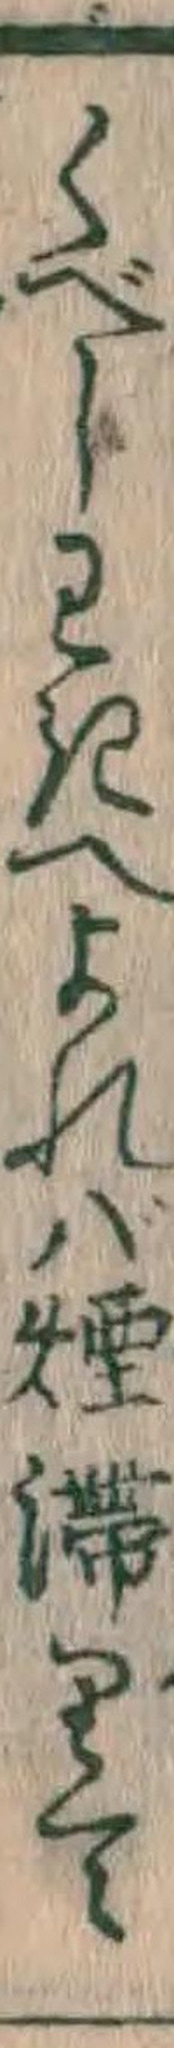くべしわきへよれば煙滞りて
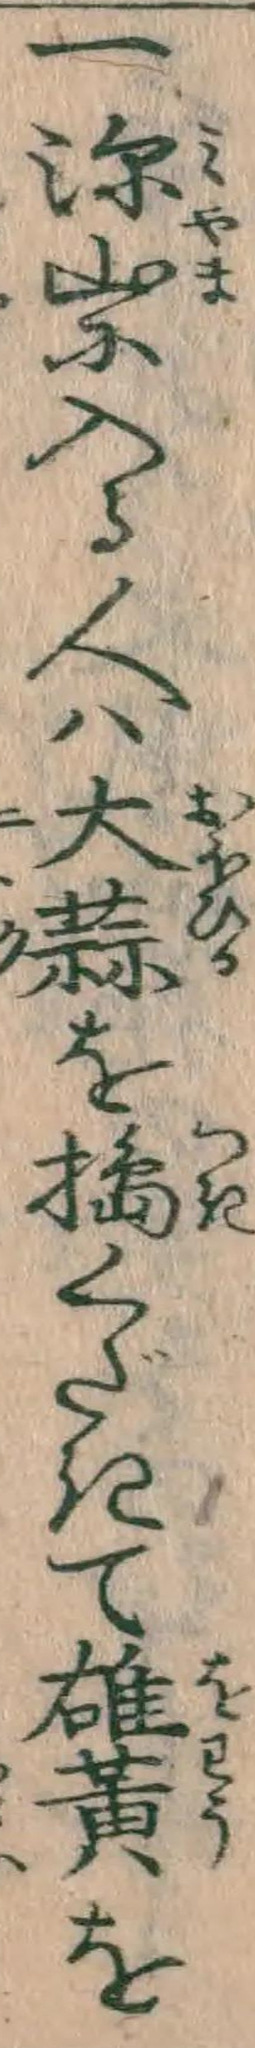一深山に入る人は大蒜搗くだきて雄黄を
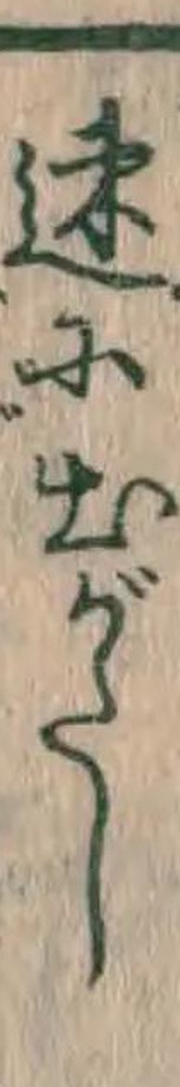速に出がたし
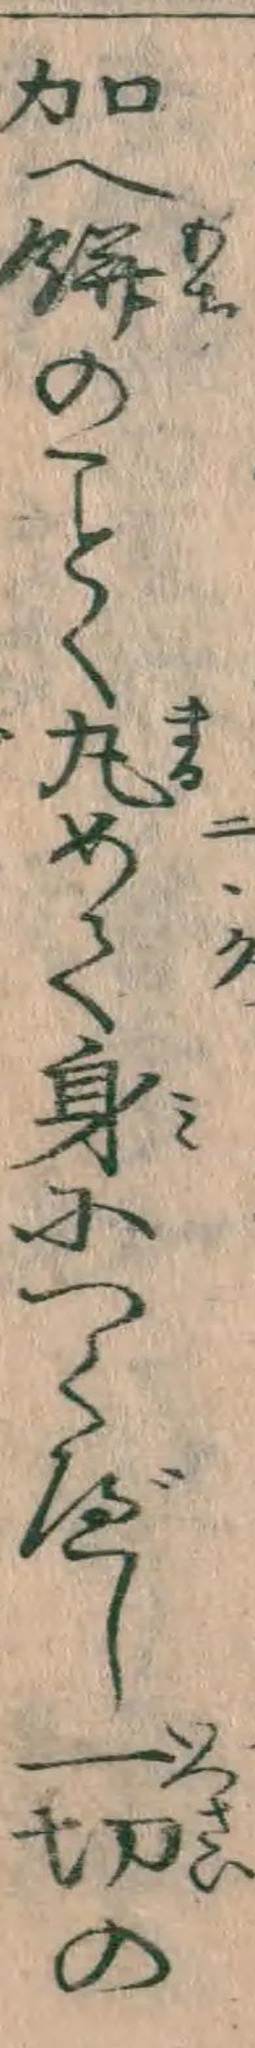加へ餅のことく丸めて身につくべし一切の
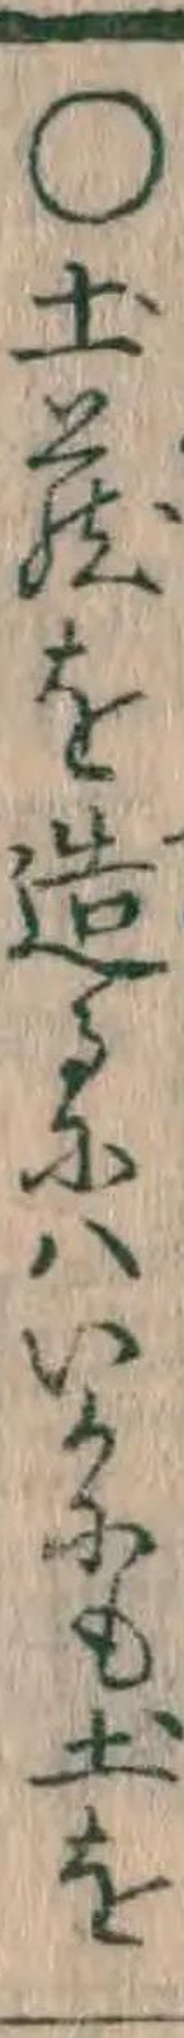○土蔵を造るにはいかにも土を
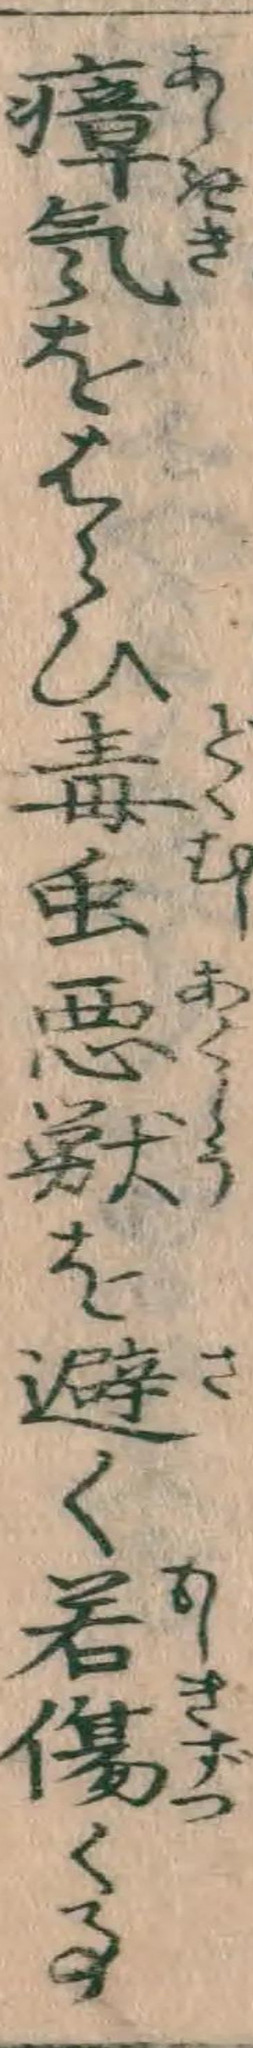瘴気をはらひ毒虫悪獣を避く若傷く事
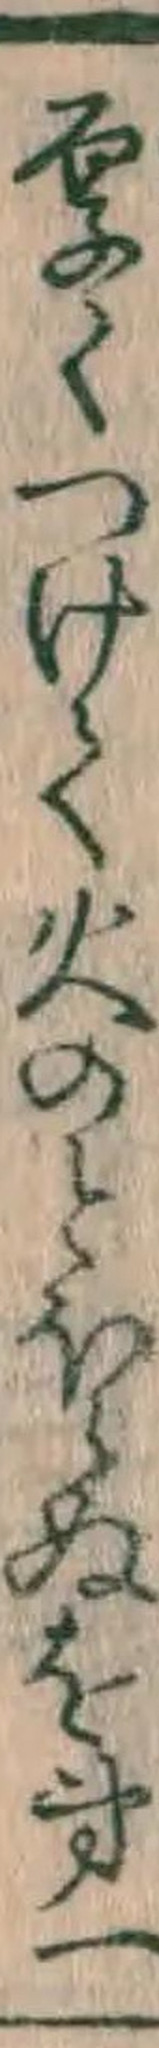厚くつけて火のとほらぬを第一
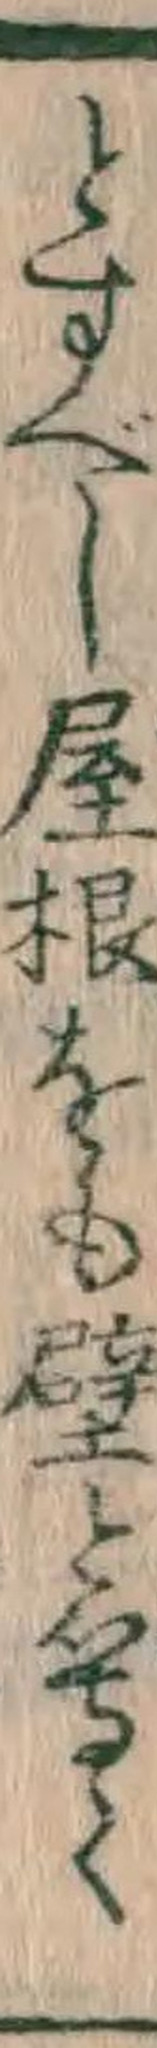とすべし屋根をも壁と等く
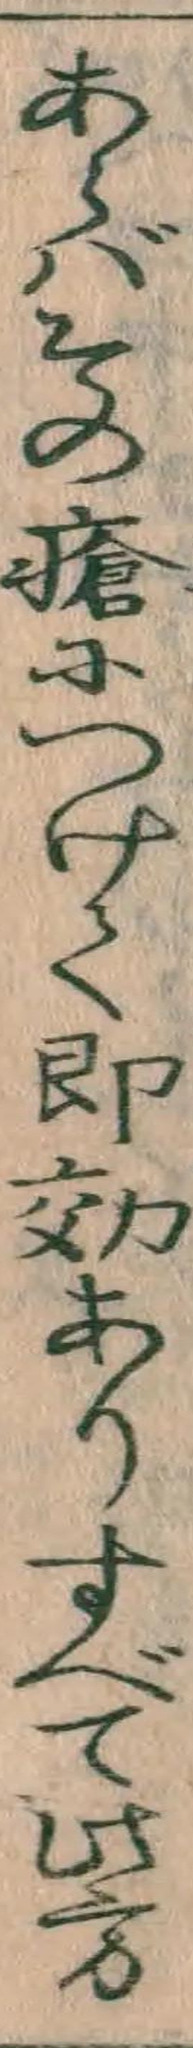あらばその瘡につけて即効ありすべて此方
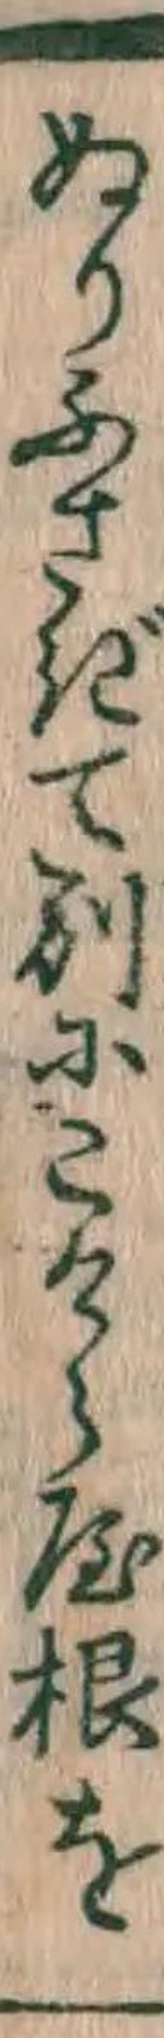ぬりふさぎて別にこけら屋根を
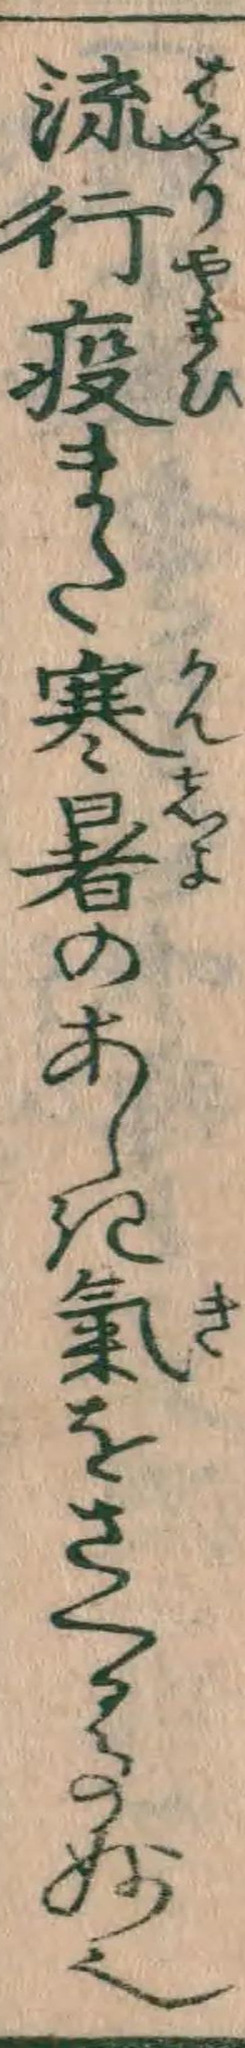流疫行また寒暑のあしき気をさくる事妙也
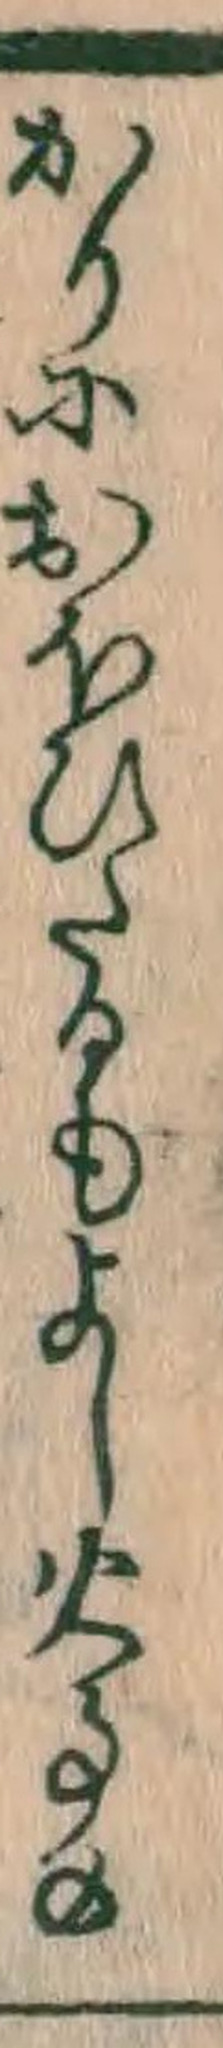かりにおほひたるもよし火事の
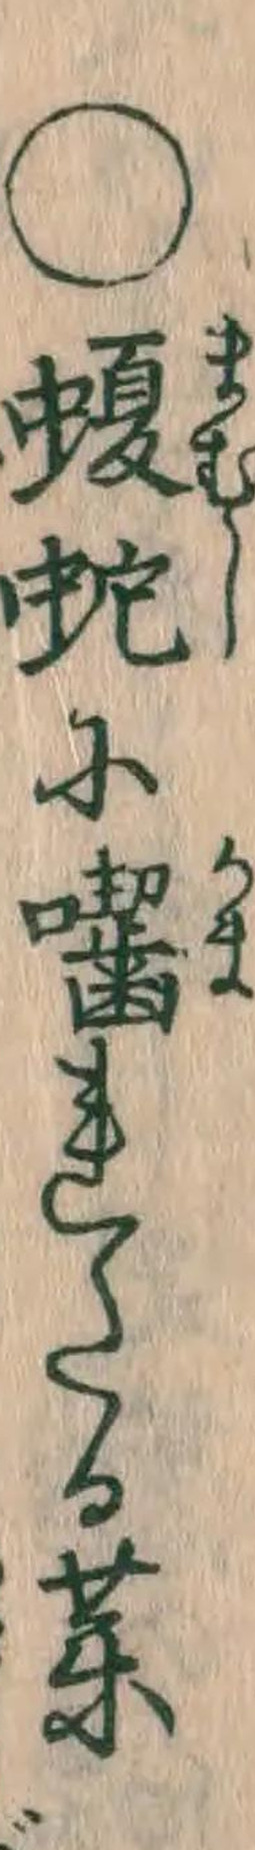○蝮蛇に囓れたる薬
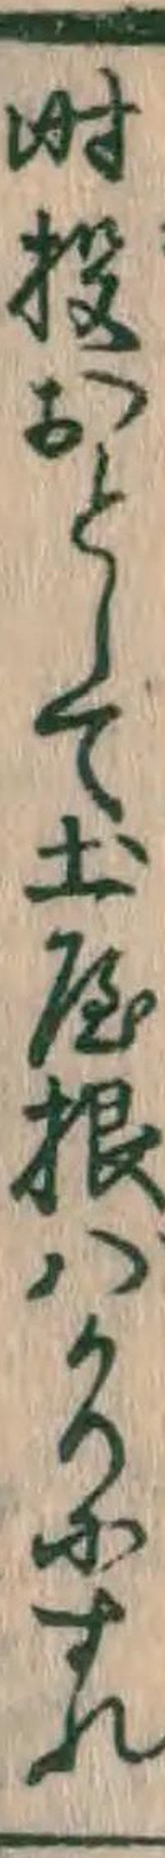時投おとして土屋根ばかりにすれ
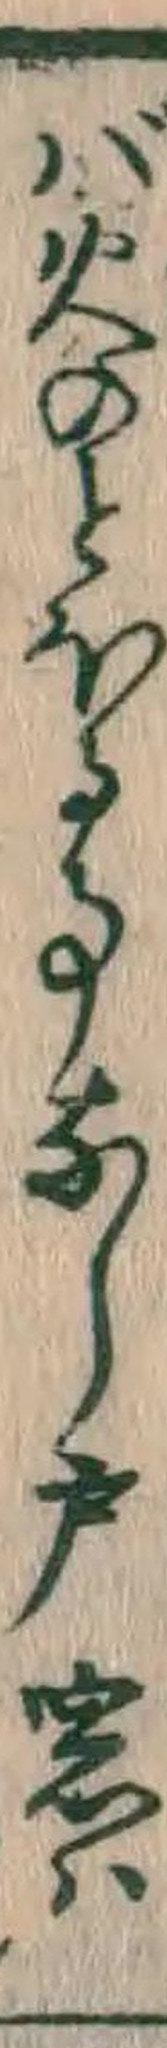ば火のとほる事なし戸窓は
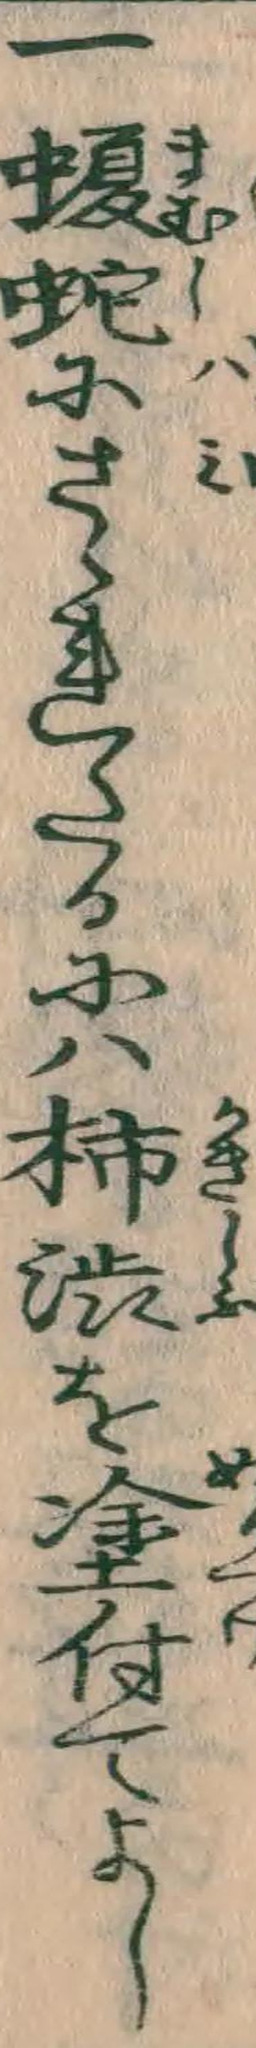一蝮蛇にさゝれたるには柿渋を塗付てよし
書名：広益秘事大全 3巻. [3]
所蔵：国立国会図書館 National Diet Library, JAPAN
